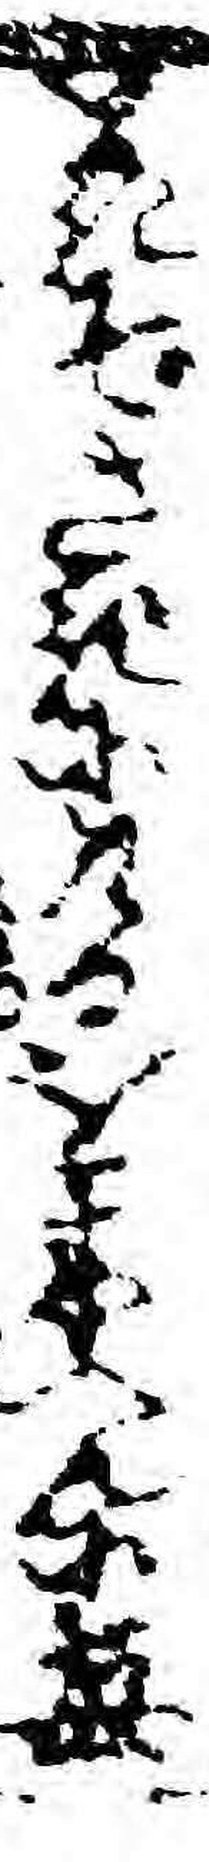花ぞさきにけるを木へんに毎
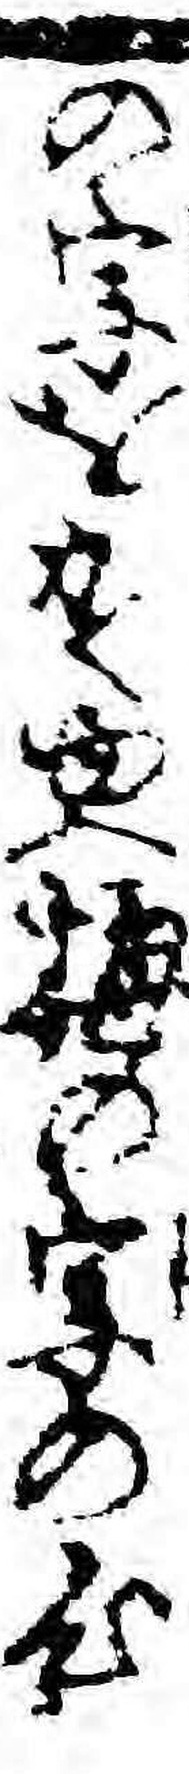の字をかくゆへ梅の字の心
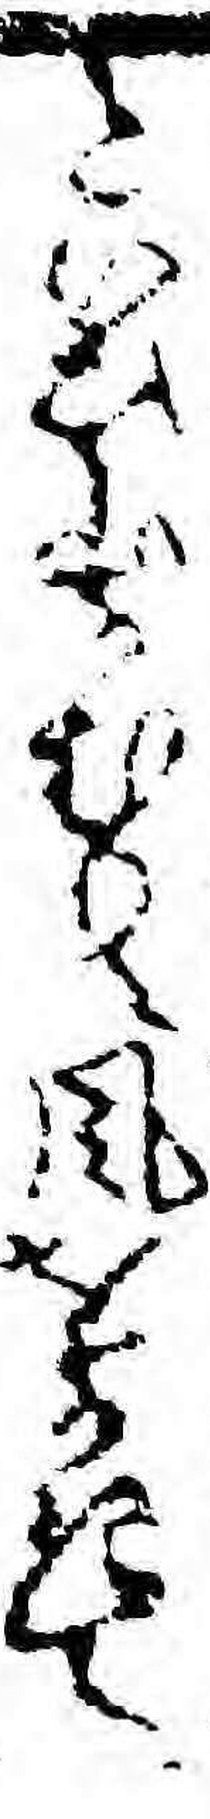といひ山かむりに風をかきて
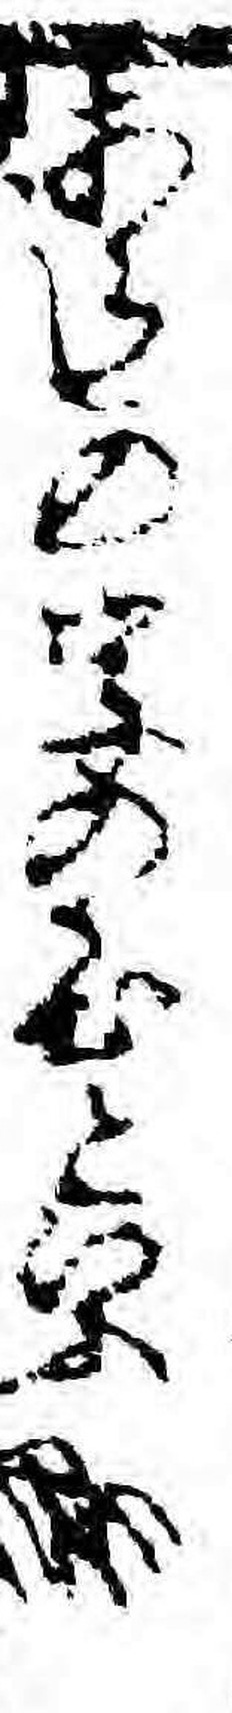あらしの字の心といふ
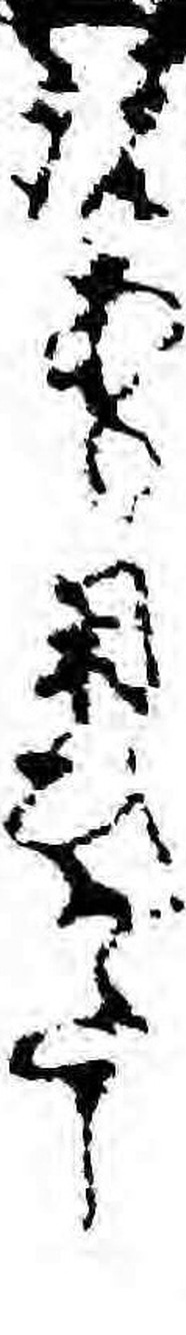あり用ひがたし
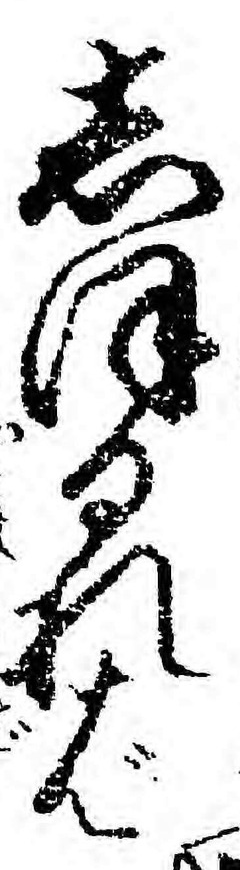しほるれば
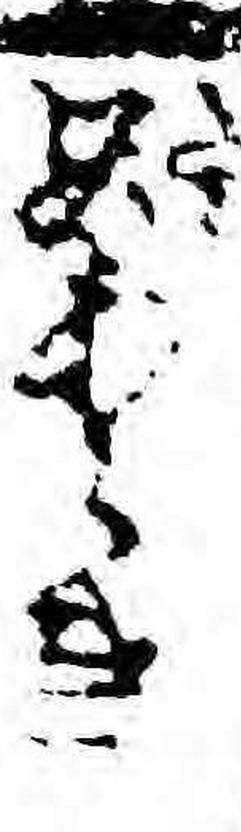只あらき
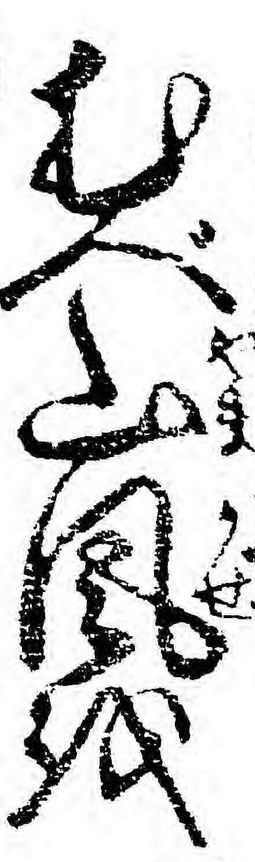むべ山風を
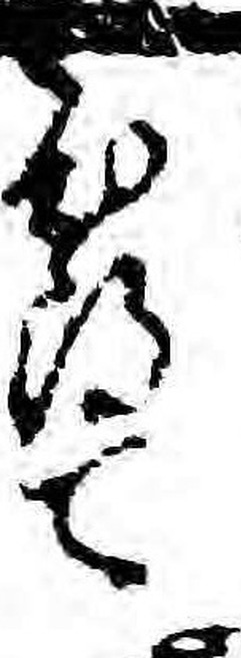心得て
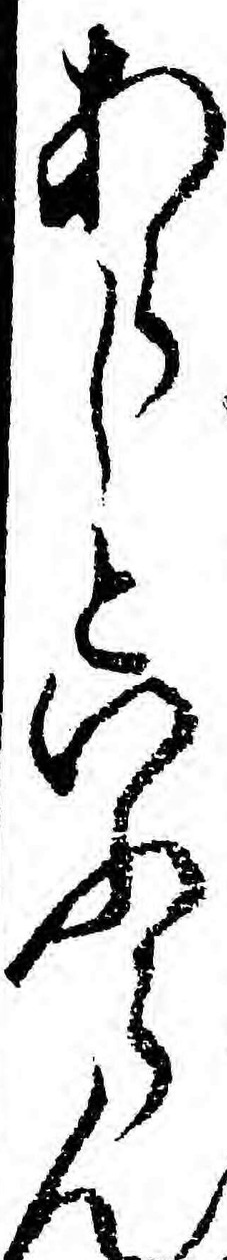あらしといふらん
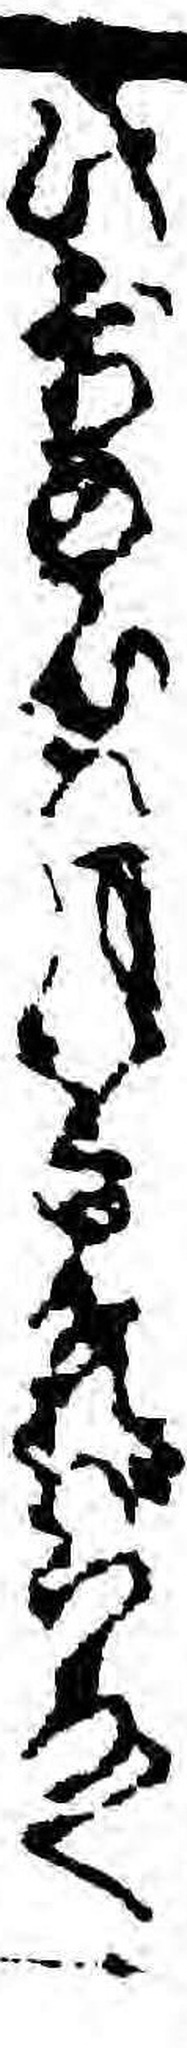此哥の心は月を見ればいろ〳〵
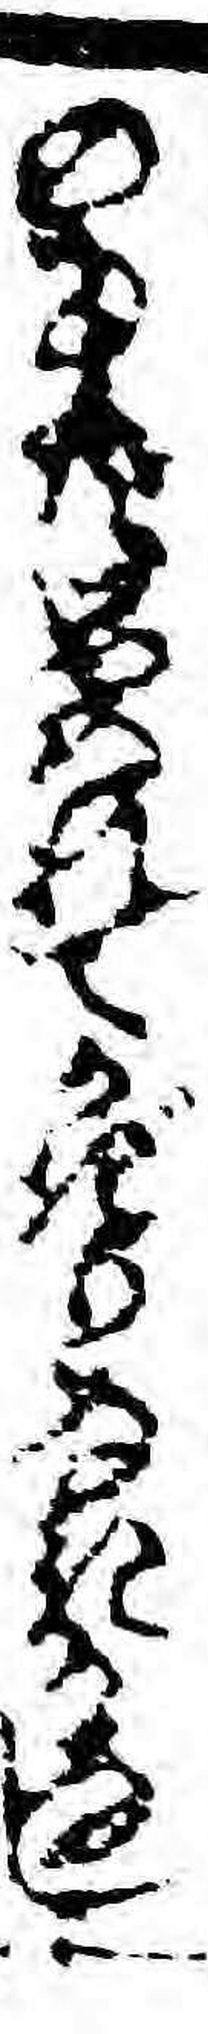の事ども思われてかぎりなきかなし
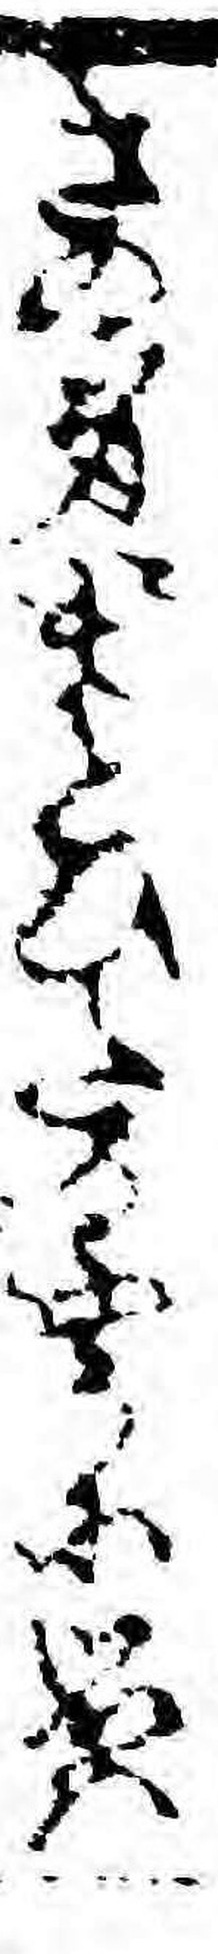さの身にまとひたるやうに思は
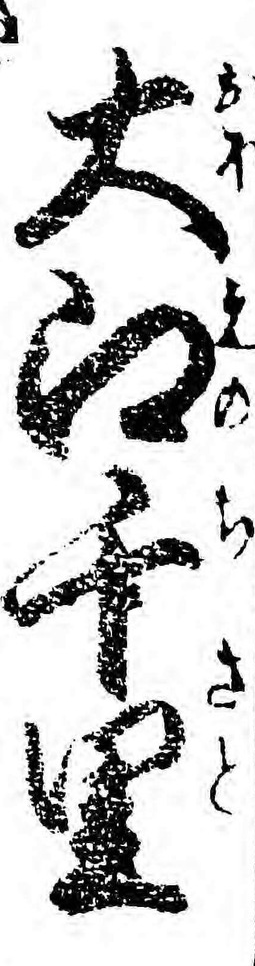大江千里
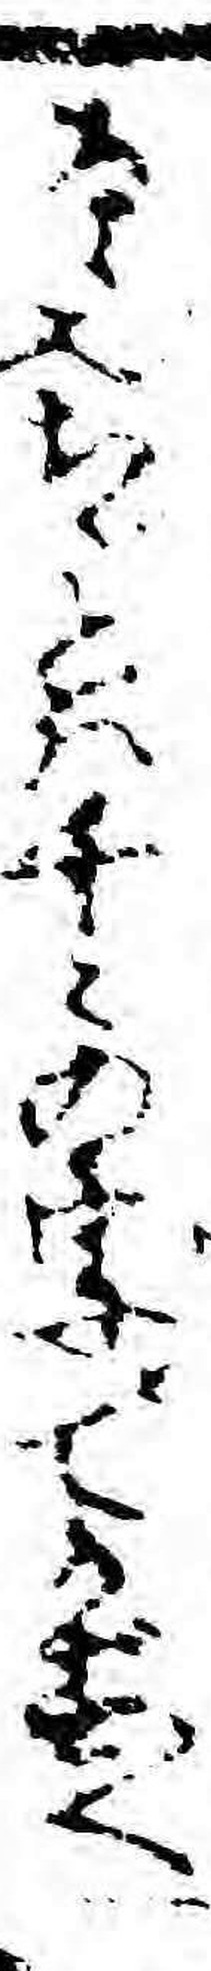るゝ也ちゞとは千々の字にてかず〳〵
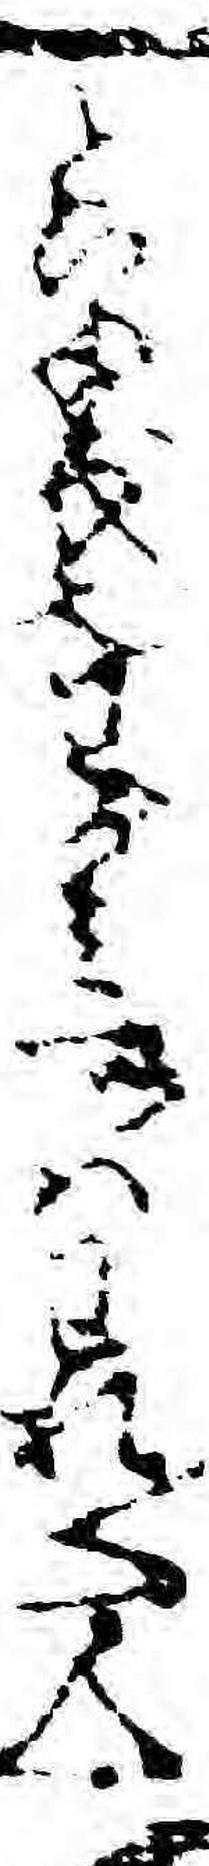といふ義也わがみ一つはわれ〳〵一人
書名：頭書和歌注譯／壽賀多百人一首小倉錦
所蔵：国文学研究資料館
